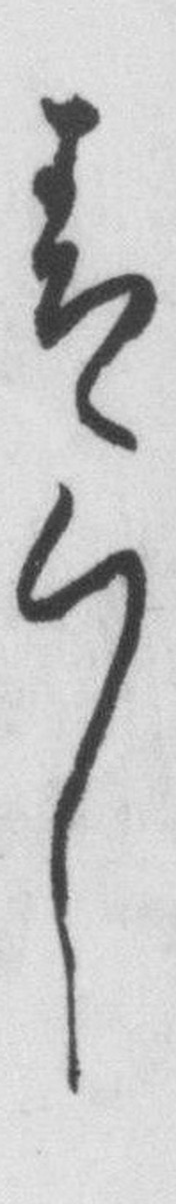青くし
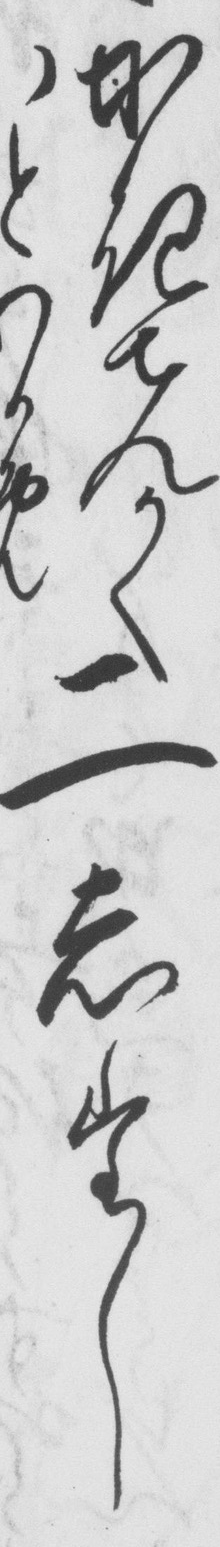初献かきてんかく二し
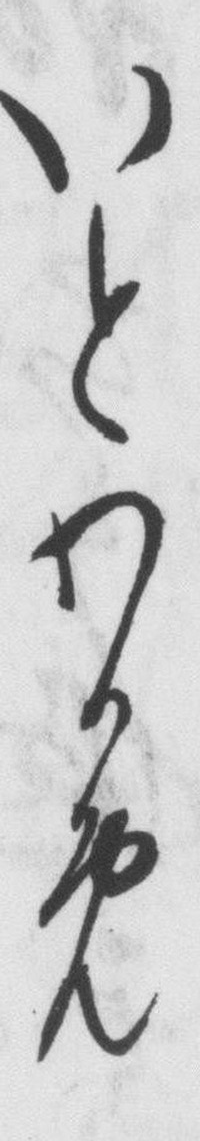いとワかめ
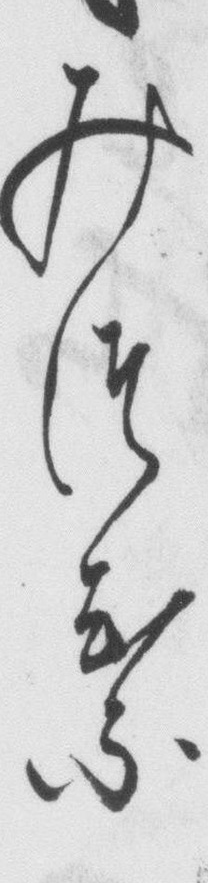みつ葉

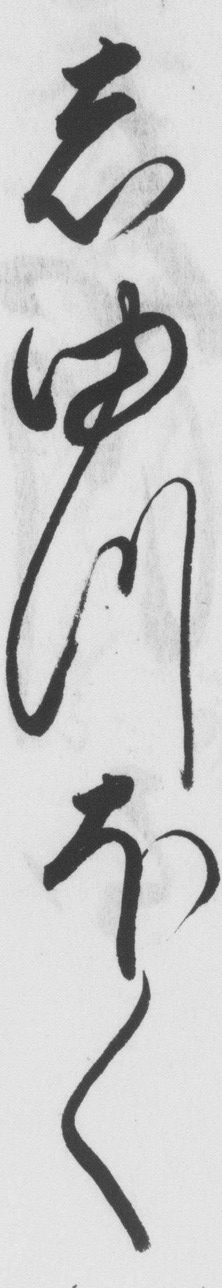しゆつぽく
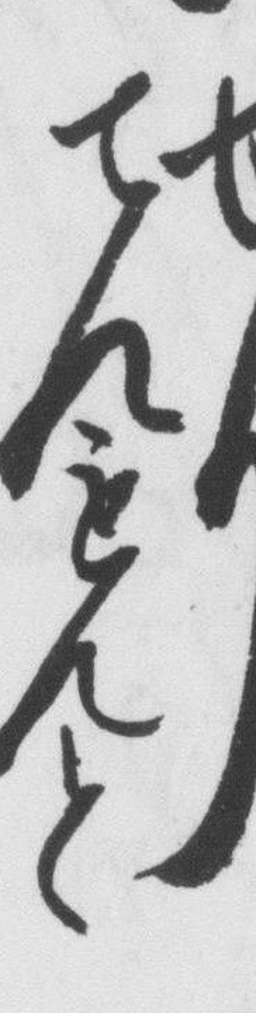てんもんと
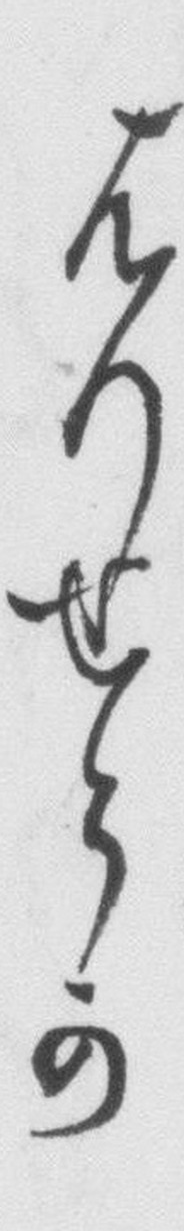はりせうか
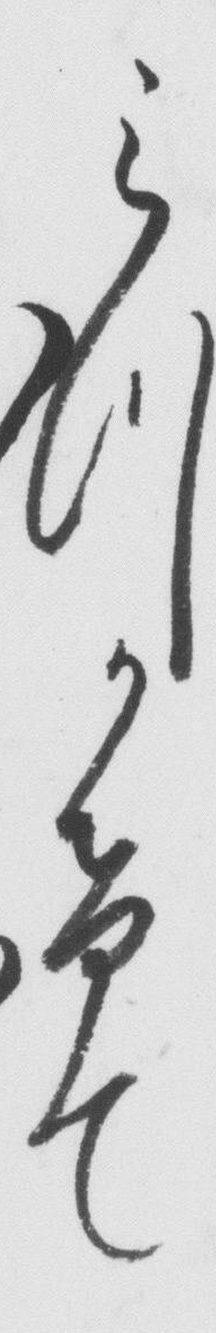ミつかけて
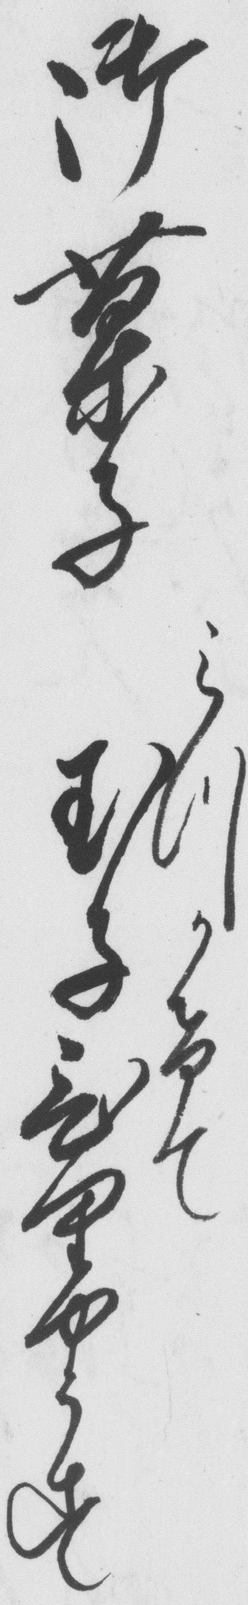御菓子玉子ひりやうす
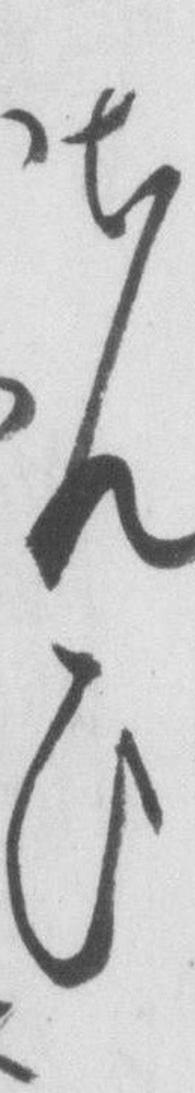ちんひ
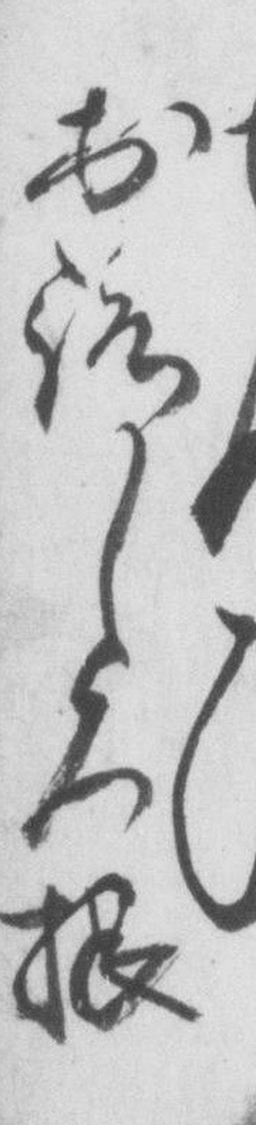おろし大根

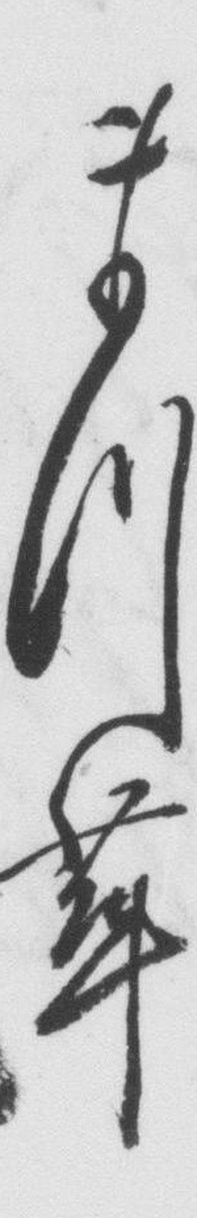まつ茸
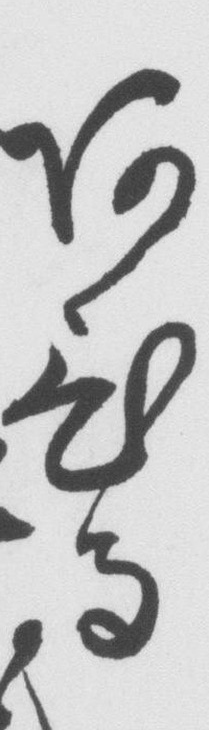あひる
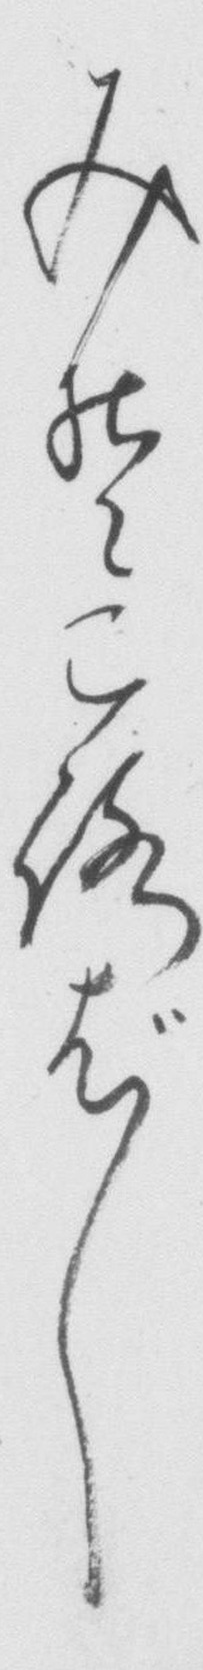みそこばし
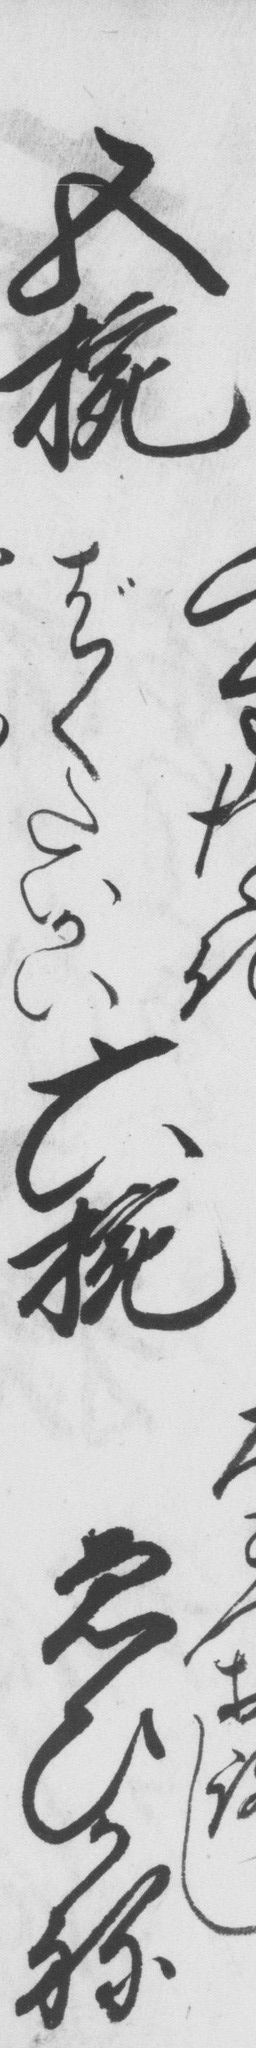五椀ばゝさいかい六椀ゑひかね
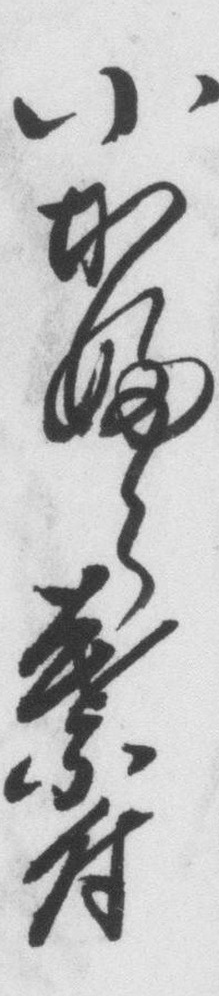小かふら葉付
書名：料理筌
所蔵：大阪府立大学学術情報センター 国文学研究資料館
